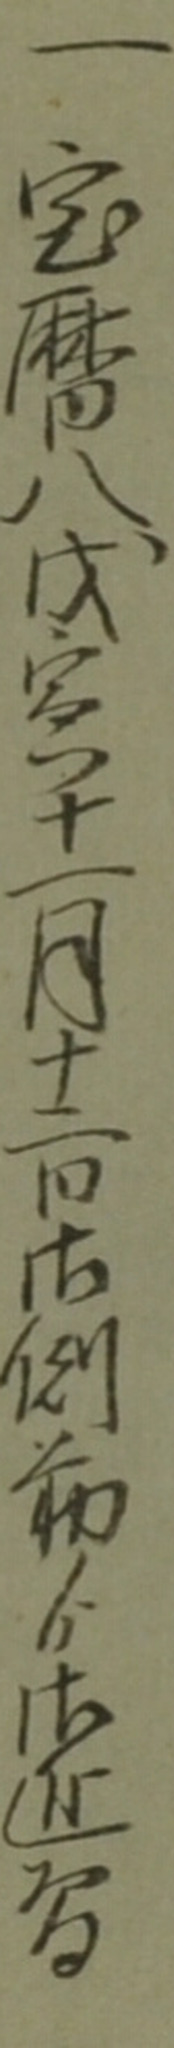一宝暦八戊寅十一月十二日御側勤ゟ御近習
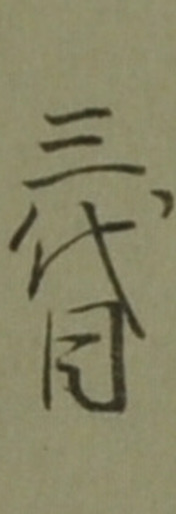三代目
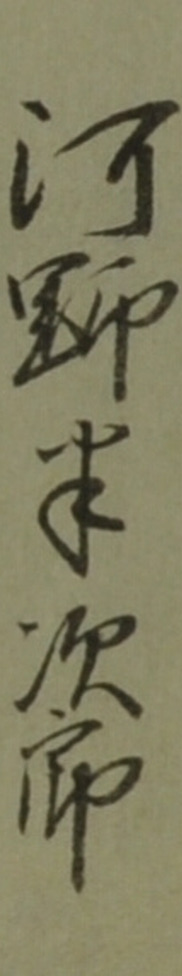河野半次郎
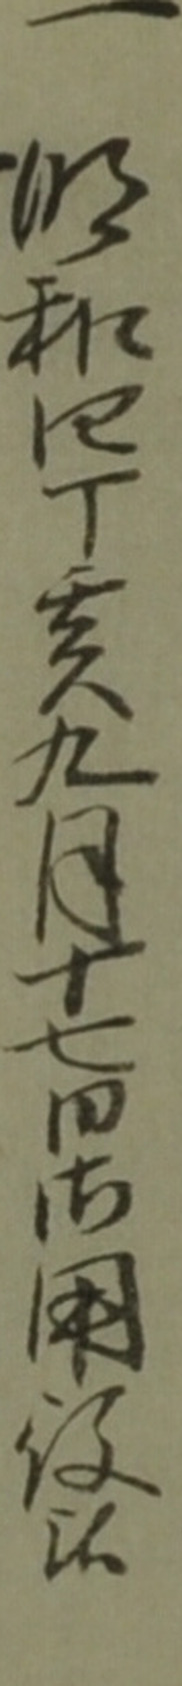一明和四丁亥九月十七日御用役被
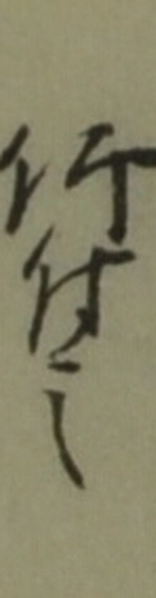仰付之
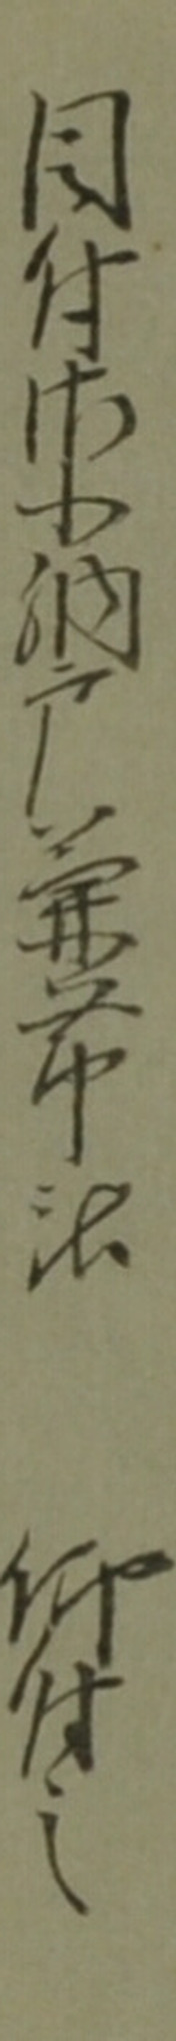目付御小納戸兼帯被仰付之
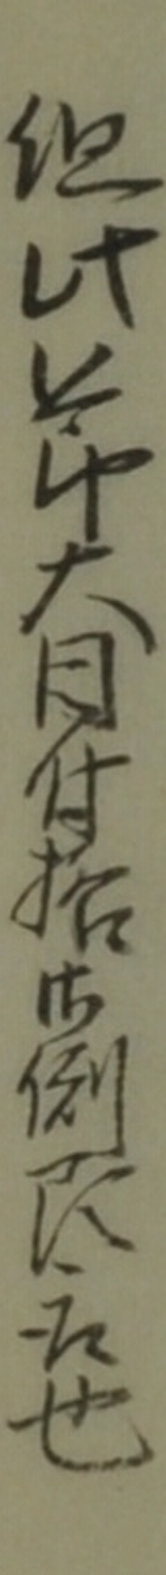但此節大目付格御側頭取也
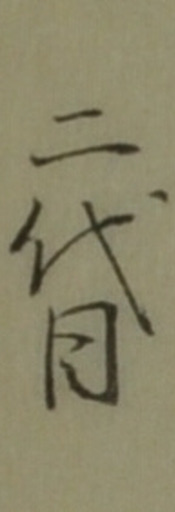二代目
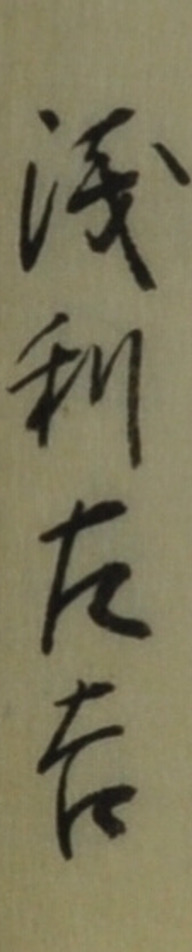浅利左吉
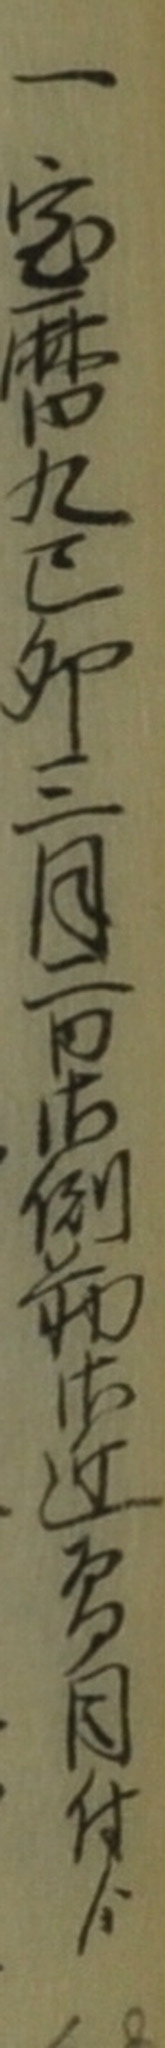一宝暦九己卯三月二日御側勤御近習目付ゟ
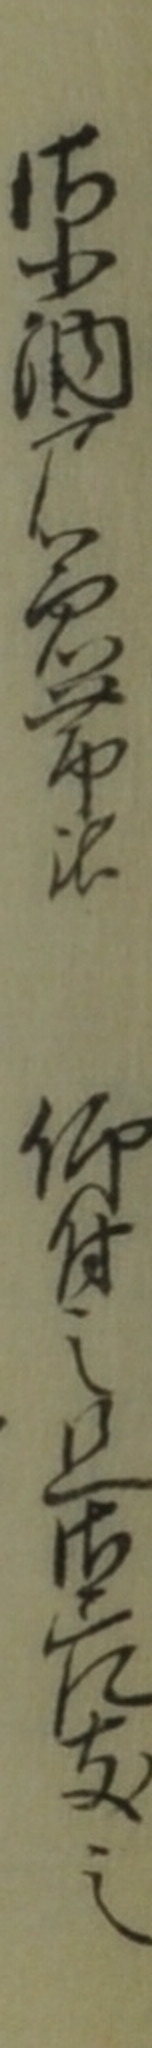御小納戸兼帯被仰付之且御差支之
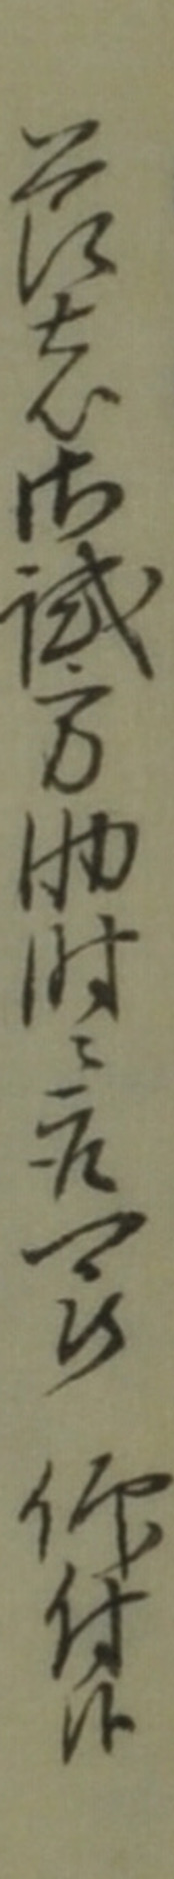節者御試方助時ニ取可被仰付候
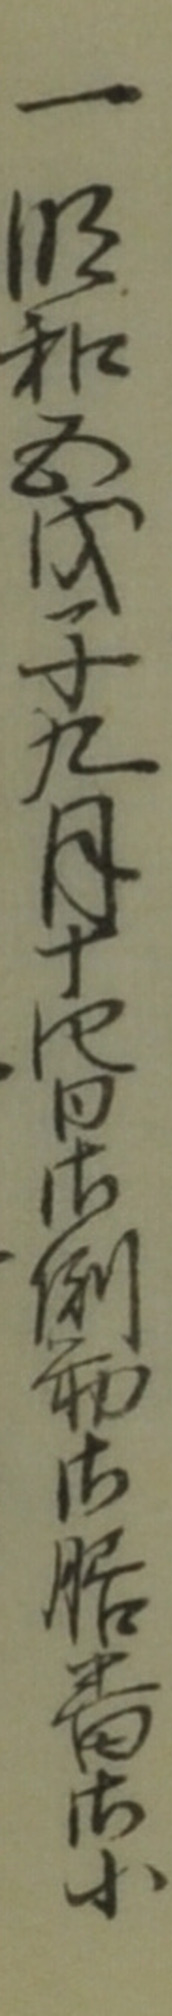一明和五戊子九月十四日御側勤御膳番御小
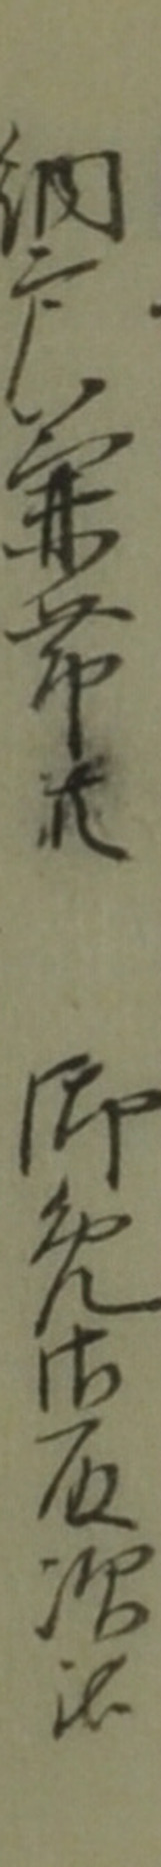納戸兼帯共御免御取次被
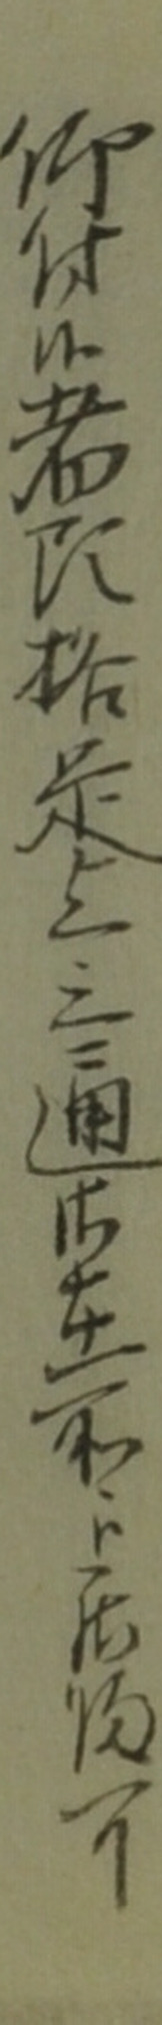仰付候者頭格是迄之通御在所江罷帰可
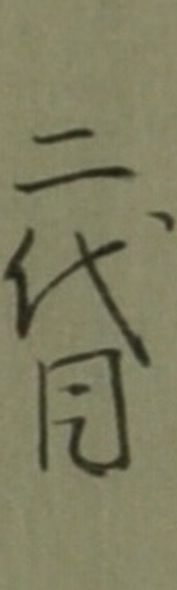二代目
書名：諸御役代々録（四）
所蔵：伊那市立高遠町図書館・合同会社AMANE
